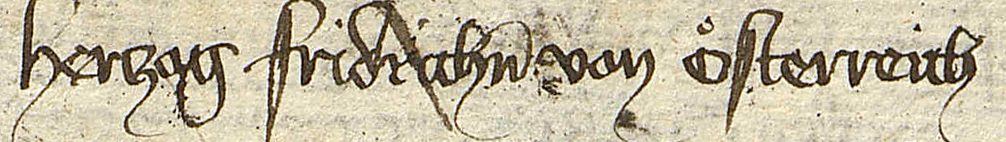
hercʒog Fridrichn* von Öſterreich
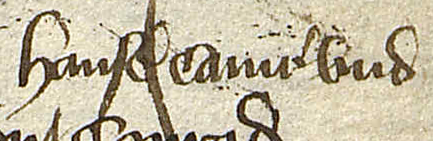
hanſe* Camr* vnd
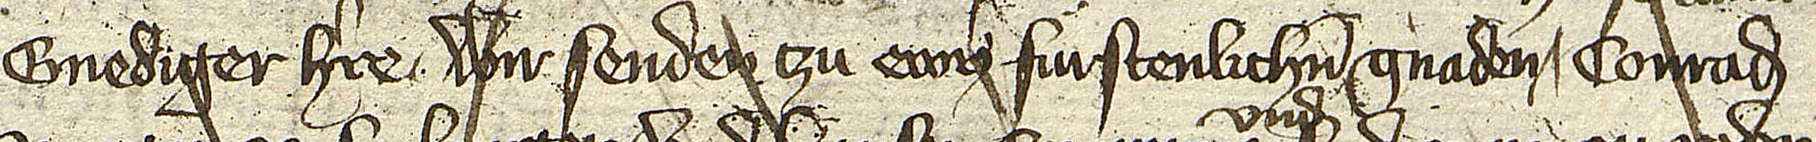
Gnediger h*re / Wir ſenden cʒu ew*n fürſtenlichn* gnaden Conrad*
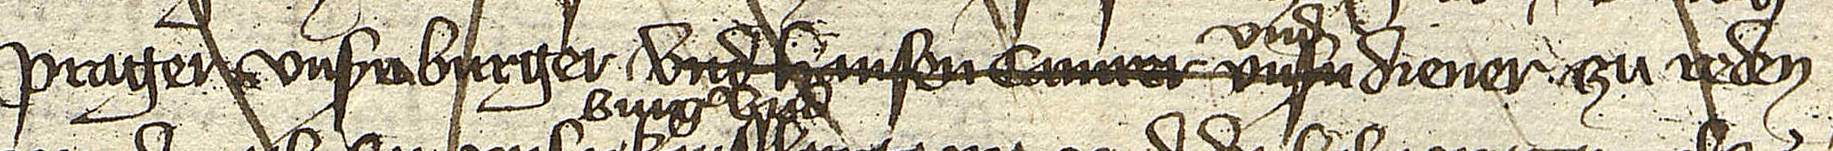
Prager vnſ*n burger / vnd hanſen Camrer vnſ*n diener cʒu reden
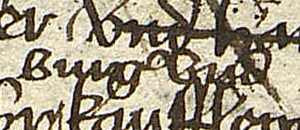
Burg* vnd
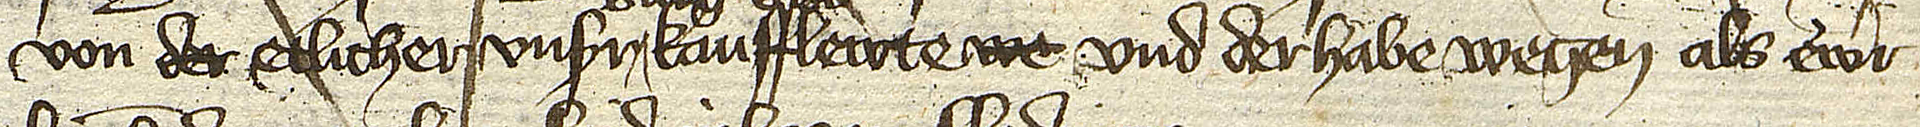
von der etlichen vnſ*r kaufflewte we vnd der habe wegen als ew*r
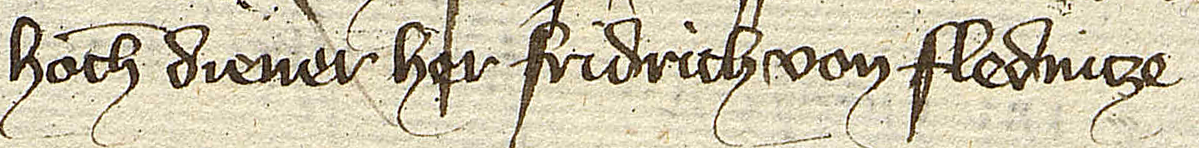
hoch* diener her fridrich von flednicʒe
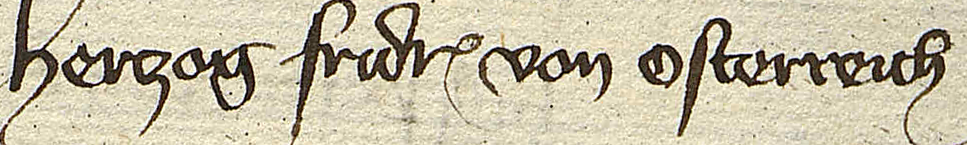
hercʒog fridr* von Oſterreich
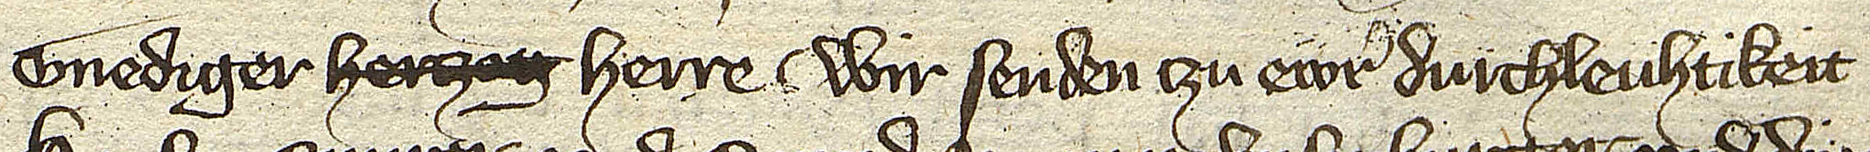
Gnediger hercʒog herre / wir ſenden cʒu ewr* durchleuhtickeit
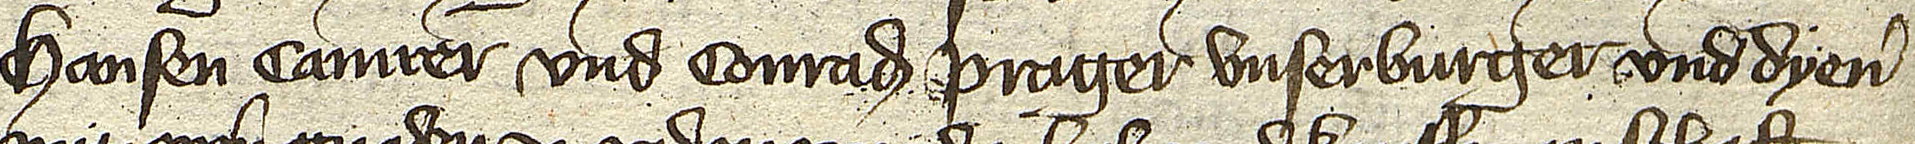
hanſen Camrer vnd Conrad* Prager vnſer burger vnd dyen*
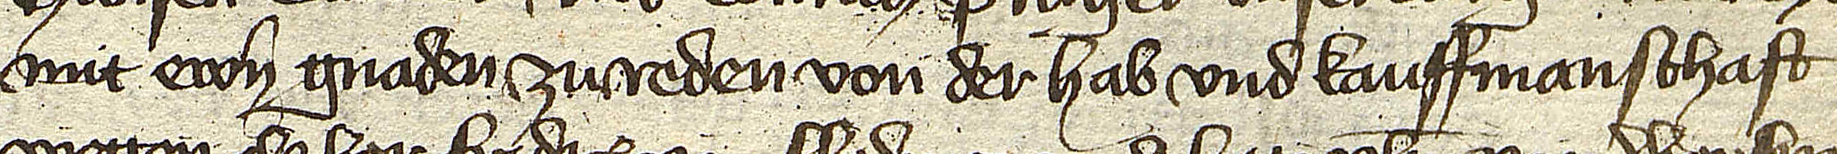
mit ew*n gnaden cʒureden von der hab vnd kauffmanſchaft
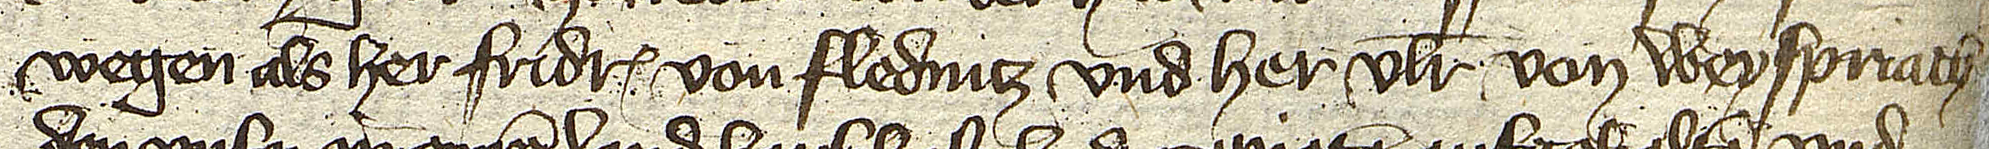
wegen als her fridr* von flednicʒ vnd her vlr* von weyſpriach
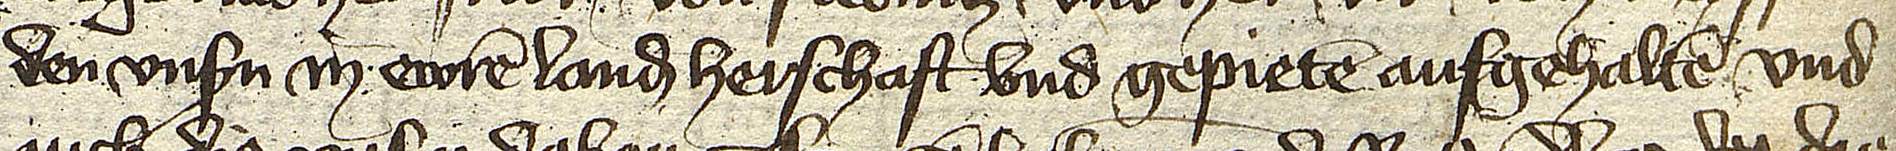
den vnſ*n in ewre* land* herſchaft vnd gepiete aufgehalte* vnd
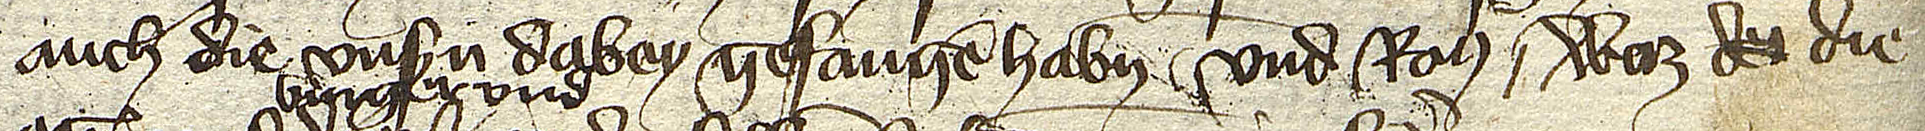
auch die vnſ*n dabey gefange* habn* / vnd Ro* / waʒ de die
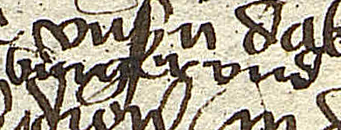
burger vnd
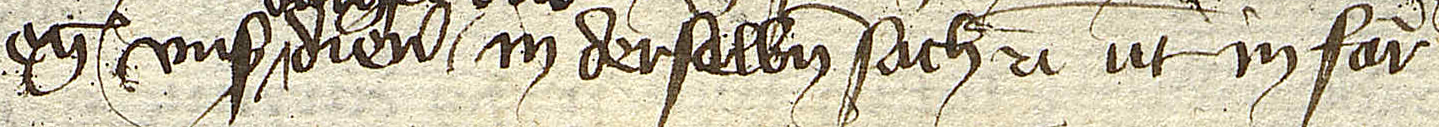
eg* vnſ* dien / in derſelbn* ſach ec* ut* in for*
